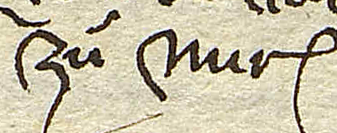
cʒü Nur*
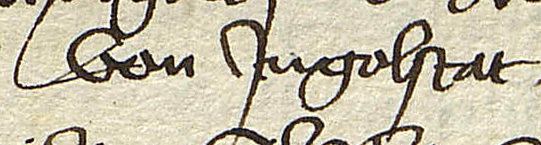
von Ingolſtat /
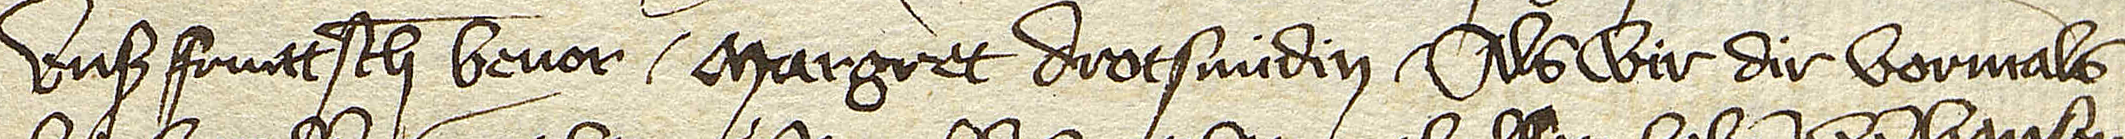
Vnſ* fruntſch* beuor / Margret Drotſmidin / Als wir dir vormals
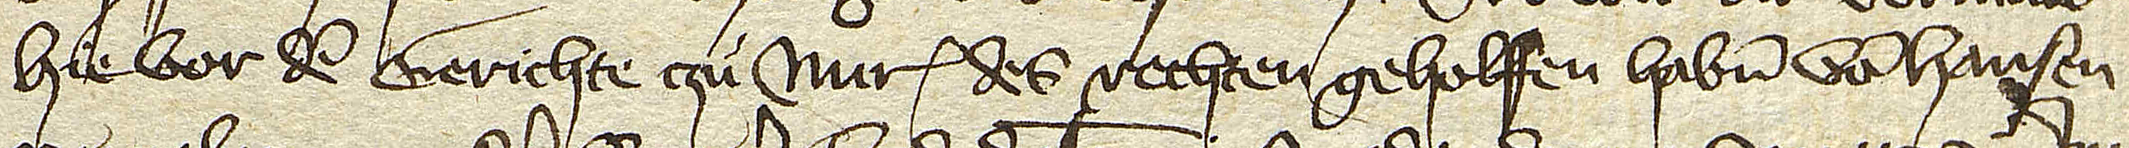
hie vor d* Gerichte cʒü Nur* des rechten geholffen habn* vo* hanſen
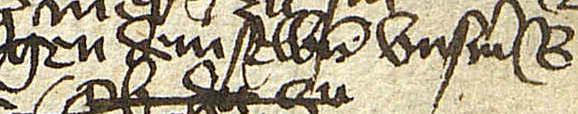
gen demſelbn* vnſm* B*
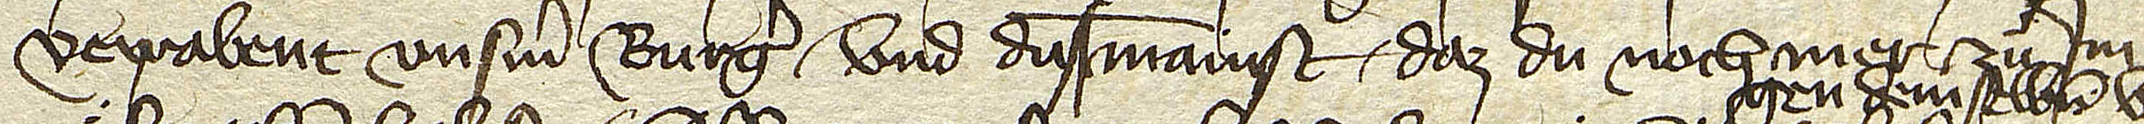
Veyrabent vnſm* Burg* / vnd du mainſt / daʒ du noch mer cʒü Im
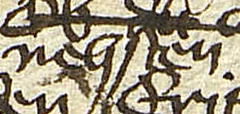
nehſten
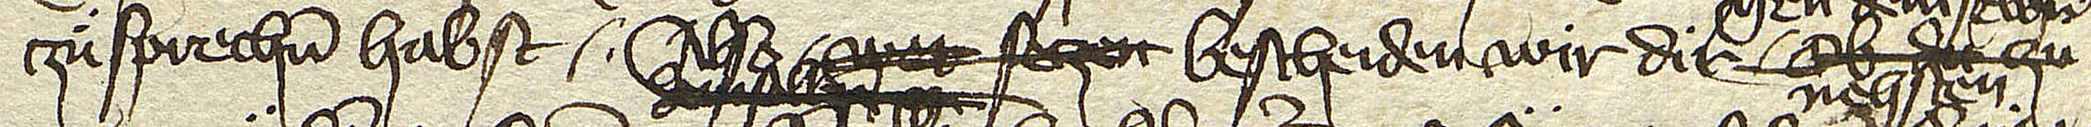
cʒüſprechn* habſt / . Alſo / wer ſecʒen beſcheiden wir dir / Ob du cʒü
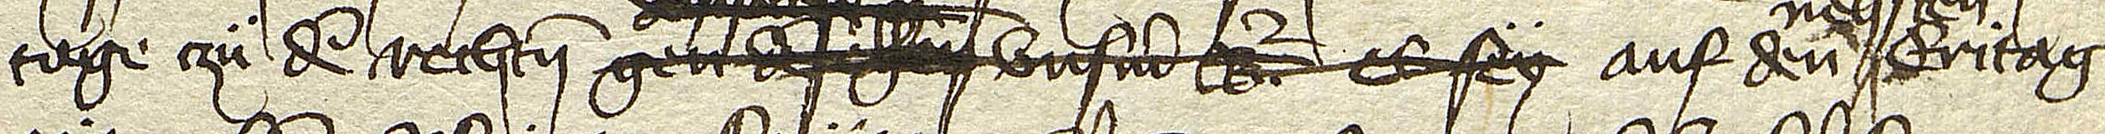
tage cʒü d* rechtn* gen de*ſelben vnſm* B* es ſey auf den Eritag
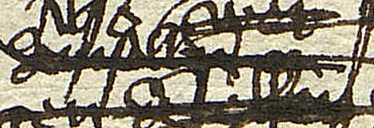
demſelbn* %
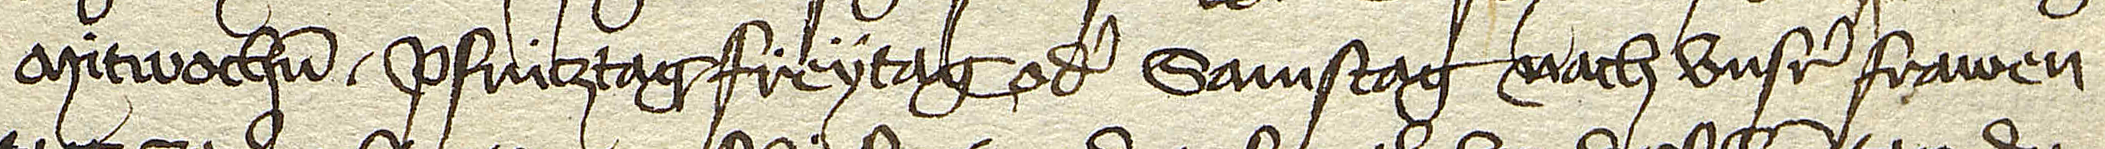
Mitwochn* / Pfincʒtag freytag od* Samſtag nach vnſr* frawen
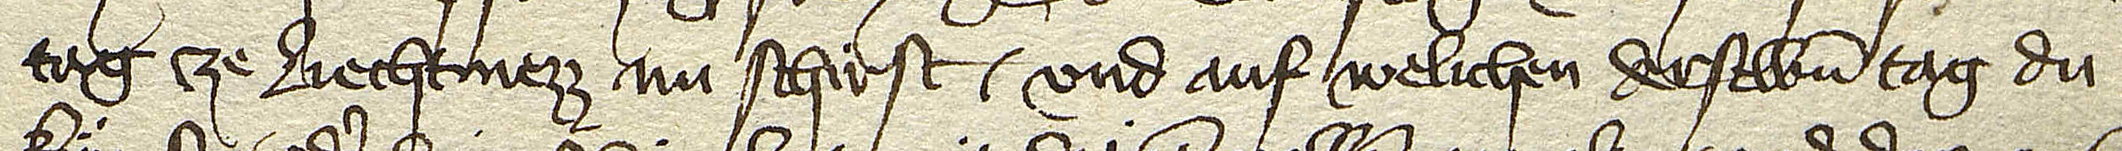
tag cʒe Liechtmeʒʒ nu ſchirſt / vnd auf welichen derſelbn* tag du
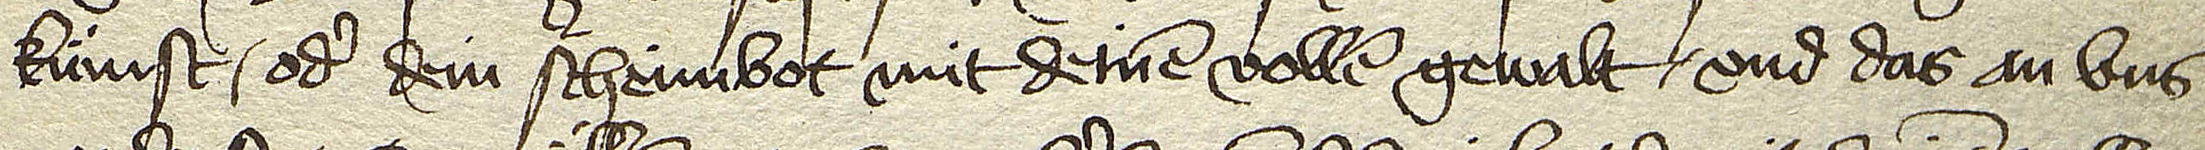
kümſt / od* dein ſcheimbot mit deine* volle* gewalt / vnd das an vns
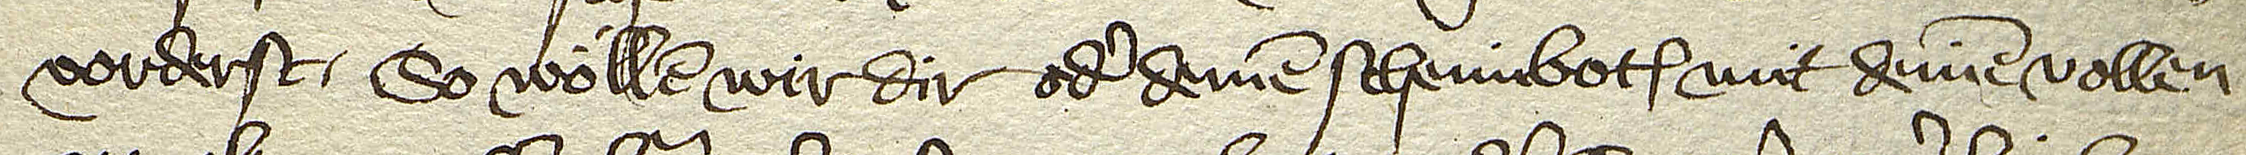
vorderſt / So wölle* wir dir od* deine* ſcheimbot* mit deine* vollen
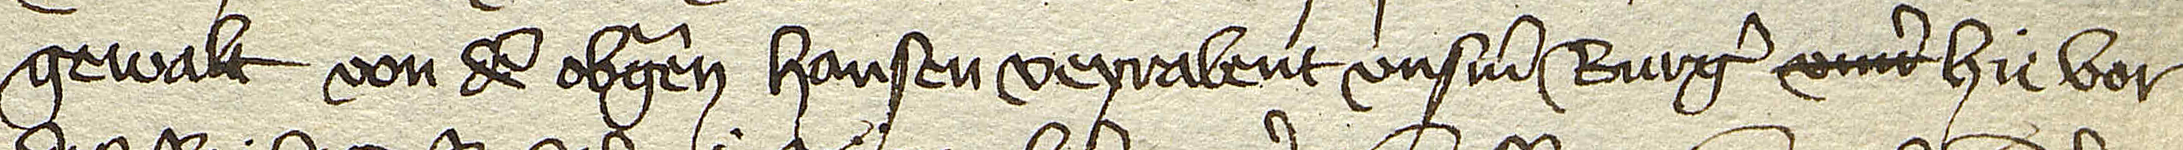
gewalt von d* obgen hanſen veyrabent vnſm* Burg* vnu* hie vor
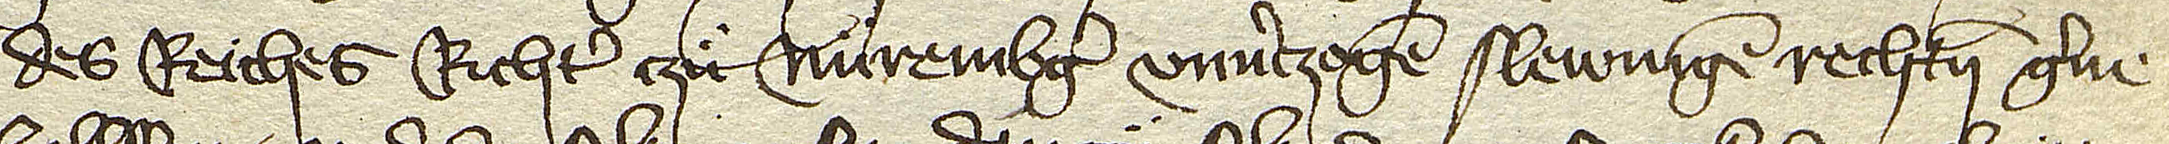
des Reiches Richt* cʒü Nürembg* vnu*cʒoge* ſlewnige* rechtn* g*ne
